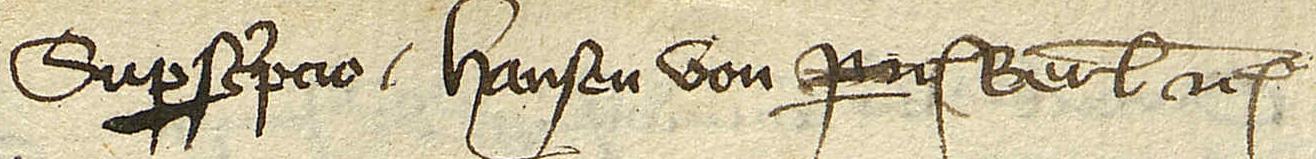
Sup*ſc*pcio / hanſen von P* ec* Berl* ec*
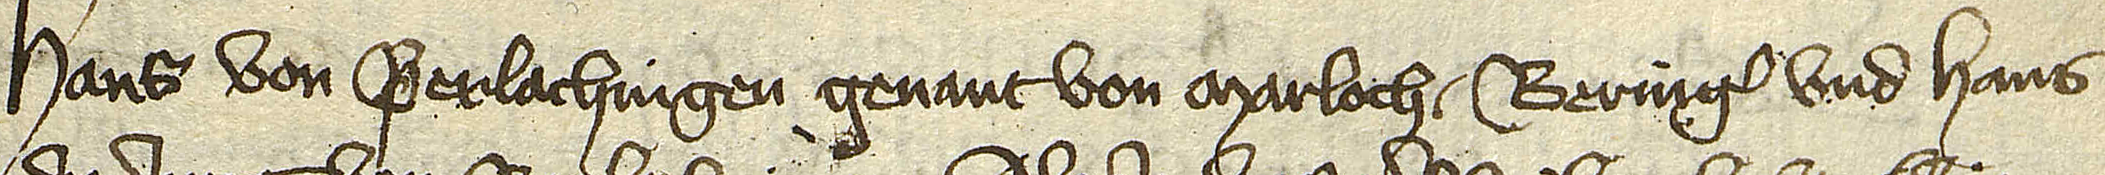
hans von Berlachingen genant von Marloch / Bering* vnd hans
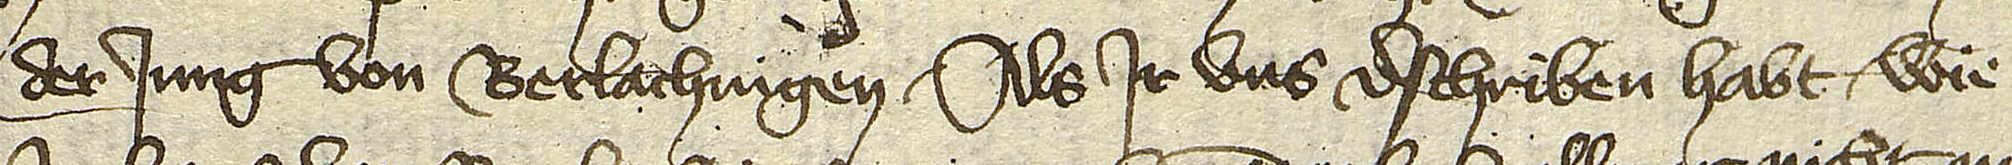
der Iung* von Berlachingen / Als Ir vns v*ſchriben habt / wie
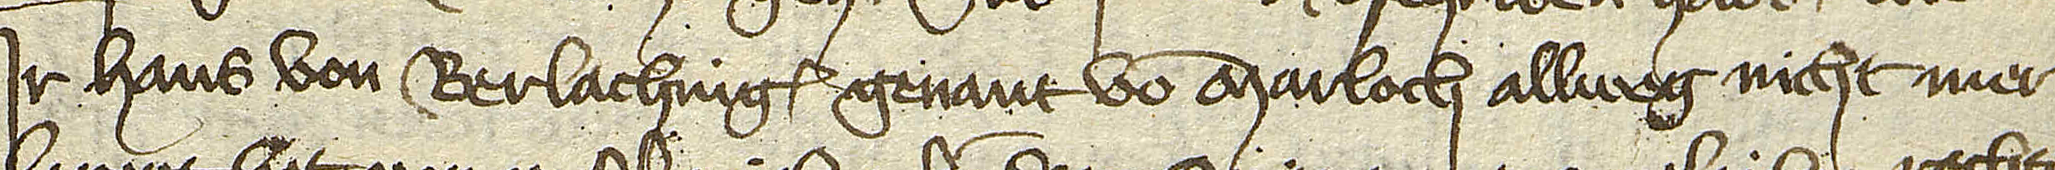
Ir hans von Berlaching* genant vo* Marloch allweg nicht mer
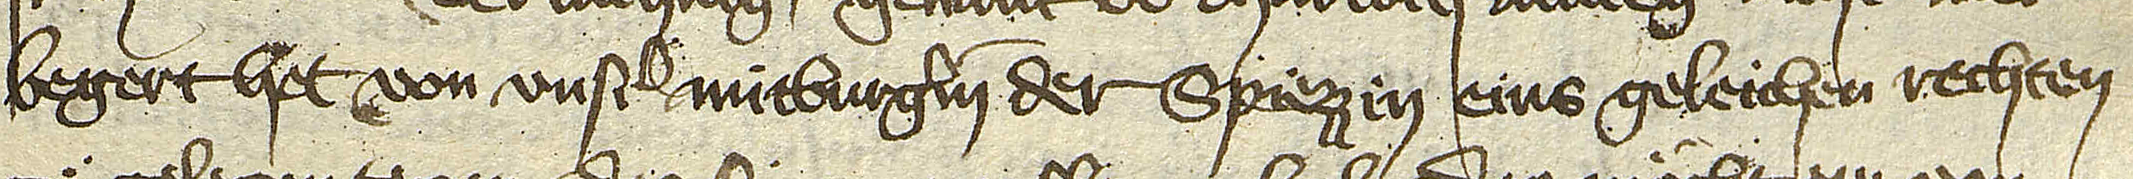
begert het von vnſr* mitburg* der Spieʒʒin eins geleichen rechten
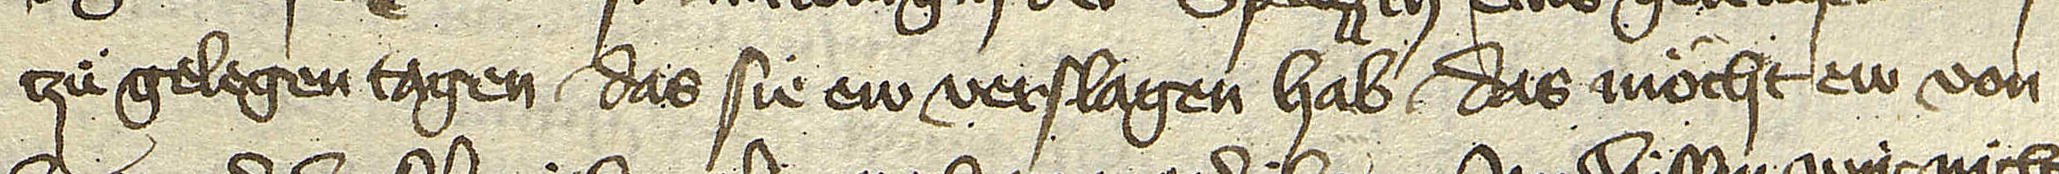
cʒü gelegen tagen / das ſie ew verſlagen hab / das möcht ew von
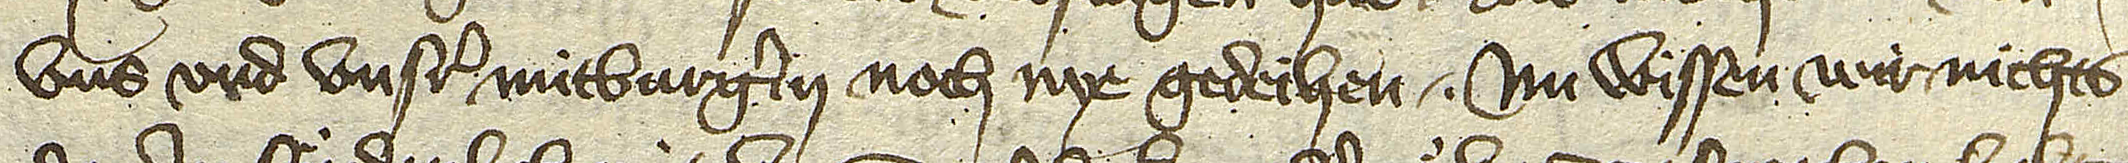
vns vnd vnſr* mitburg*in noch nye gedeihen / . Nu wiſſen wir nichts
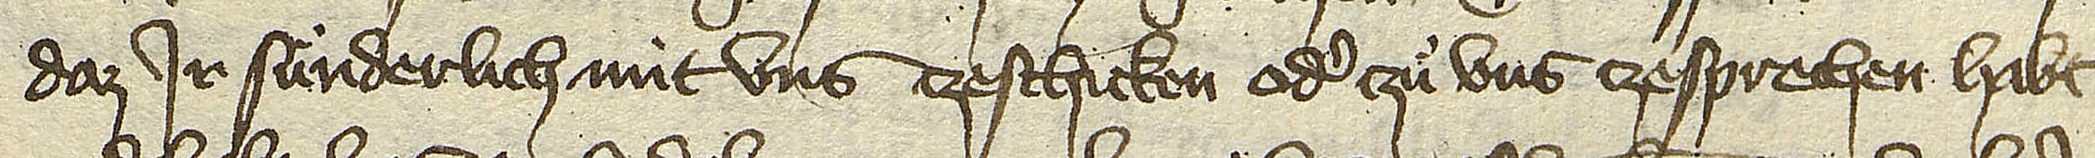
daʒ Ir ſünderlich mit vns cʒeſchicken od* cʒü vns cʒeſprechen habt
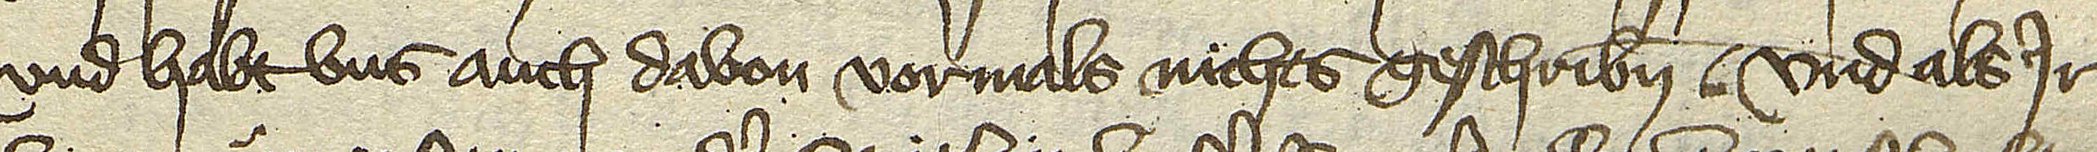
vnd habt vns auch davon vormals nichts geſchribn* / vnd als Ir
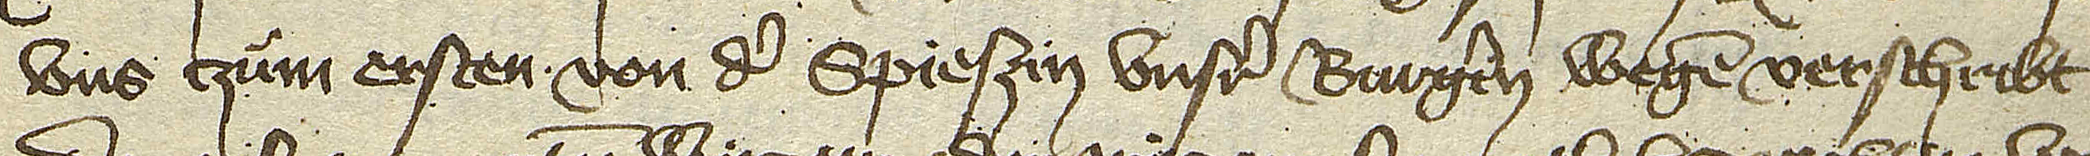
vns cʒüm erſten von d* Spieſʒin vnſr* Burg*in wege* verſchribt
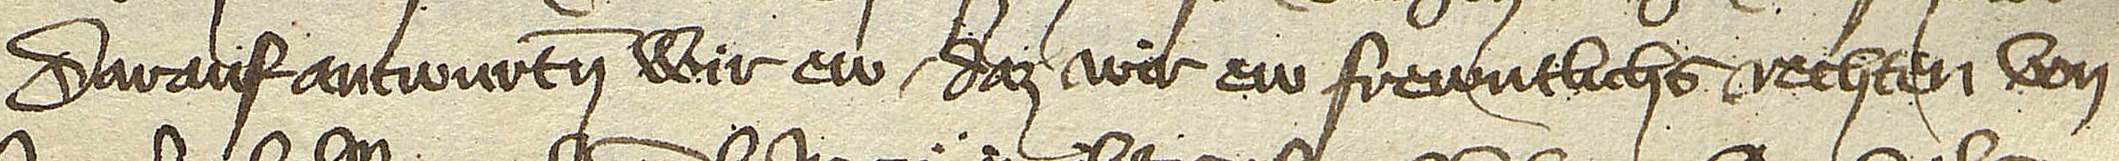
Darauf antwurtn* wir ew / daʒ wir ew frewntlichs rechten von
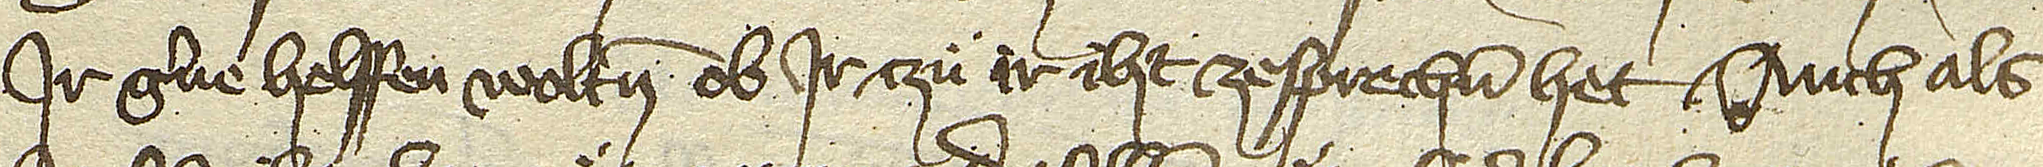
Ir g*ne helffen woltn* ob Ir cʒü ir iht cʒeſprechn* het / Auch als
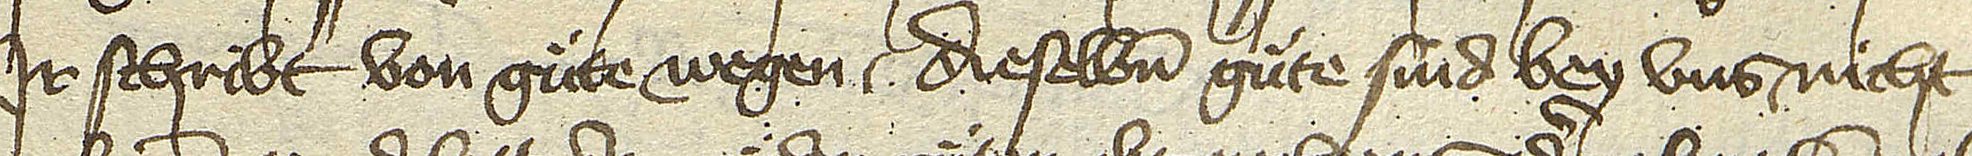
Ir ſchribt von güte wegen / Dieſelbn* güte ſind bey vns nicht
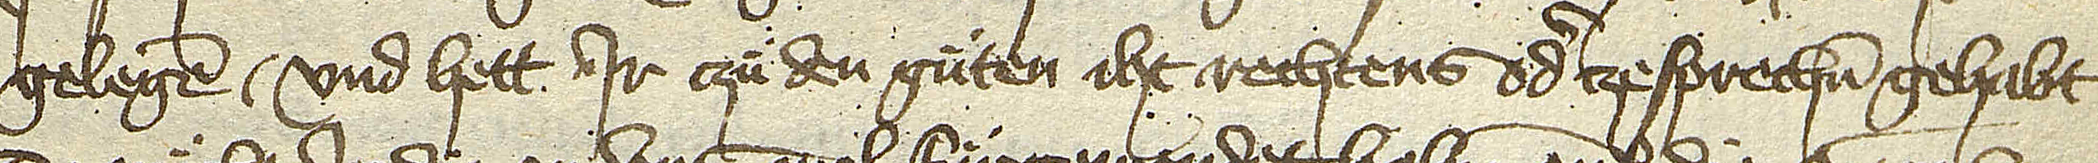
gelege* / vnd hett Ir cʒü den güten iht rechtens od* cʒeſprechn* gehabt
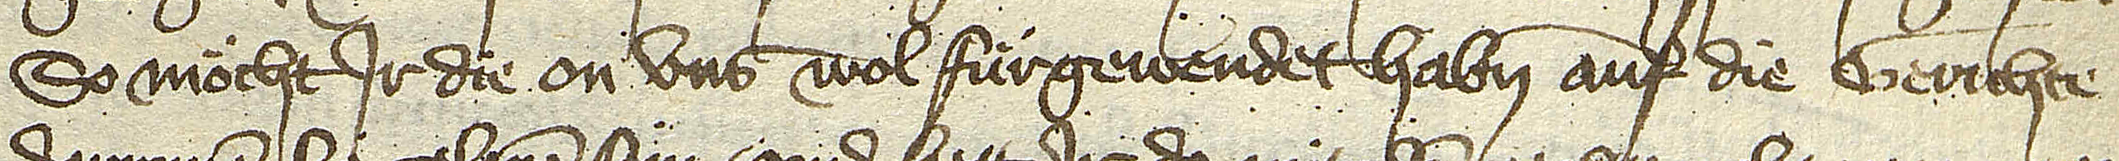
So möcht Ir die on vns wol fürgewendet habn* auf die Gerichte
